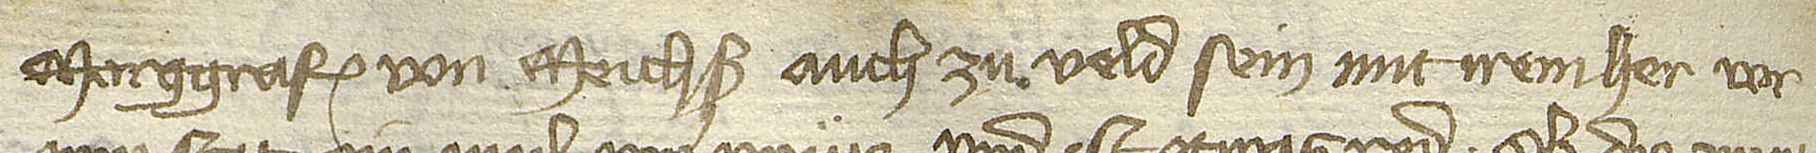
Marggraf* von Meichſ* auch ʒu veld ſein mit irem her vor
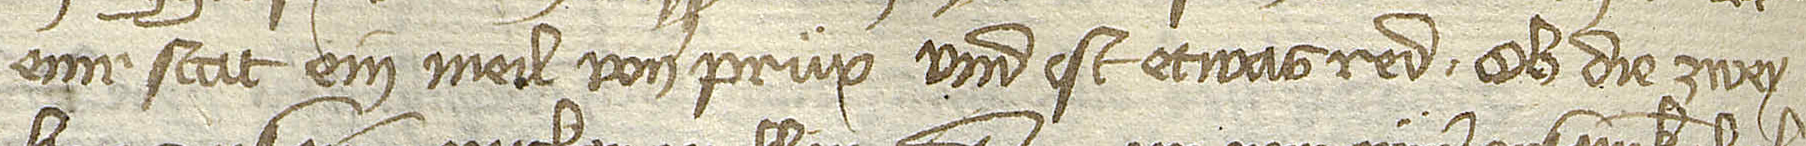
einr ſtat ein meil von prüx vnd iſt etwas red . Ob die ʒwey
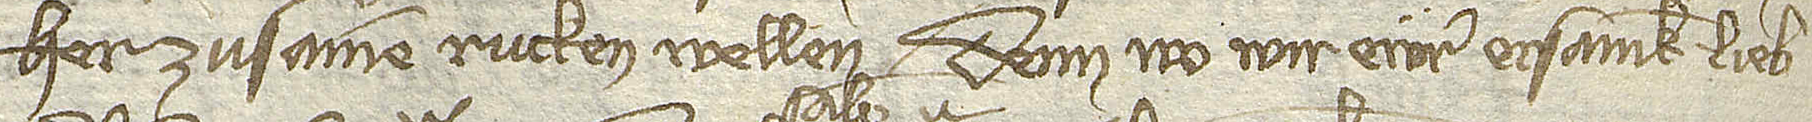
her ʒuſame* rucken wellen / Denn wo wir ewr* erſamk* lieb
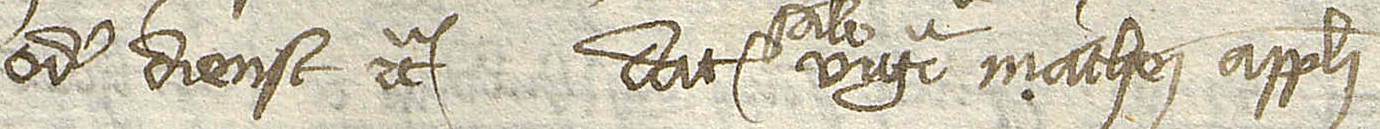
od* dienſt ec* Dat* vigi* mathei appli*
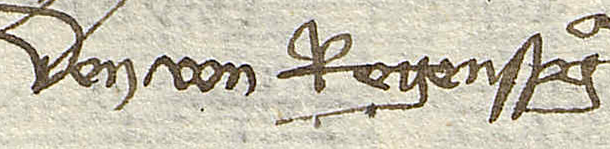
Den von Regenſpg*
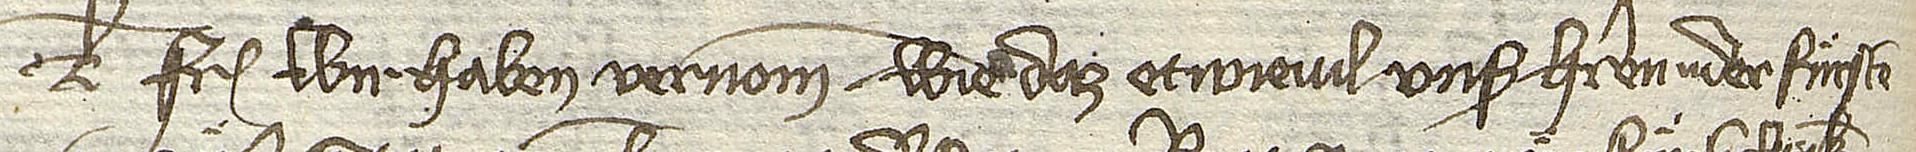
L* fr* Wir . haben vernom* / wie daʒ etwieuil vnſ* hren* ~ der fürſte*
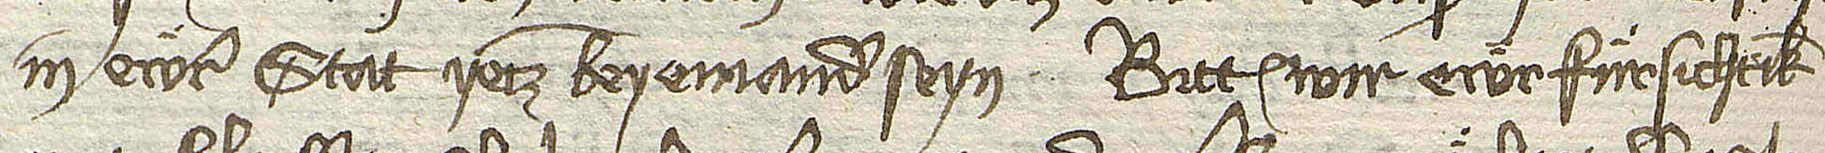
in ewr* Stat yecʒ* beyeinand* ſeyn Bitt* wir ewr* fürſichtik*
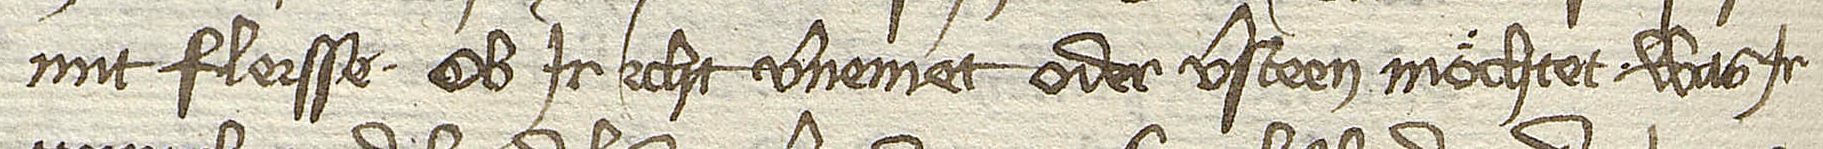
mit fleiſſe . Ob Ir icht v*nemet oder v*ſteen möchtet . Was Ir
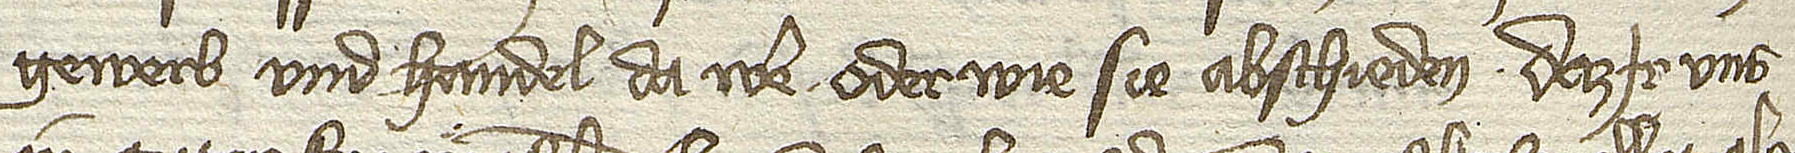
gewerb vnd handel da we* / oder wie ſie abſchieden . daʒ Ir vns
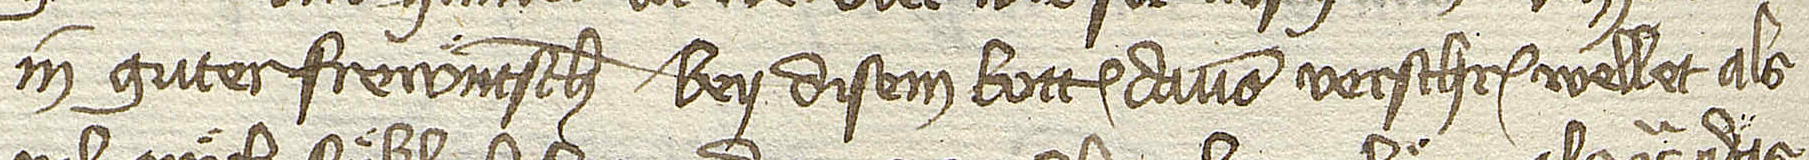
in guter frewntſch* / bey diſem bott* dauo* verſchr* wellet als
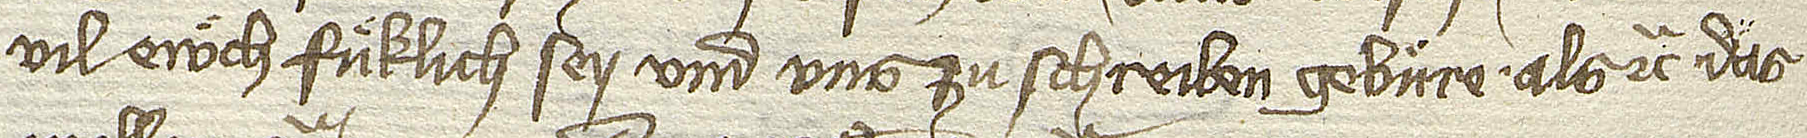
vil ewch füklich ſey vnd vns ʒu ſchreiben gebüre . als ec* das
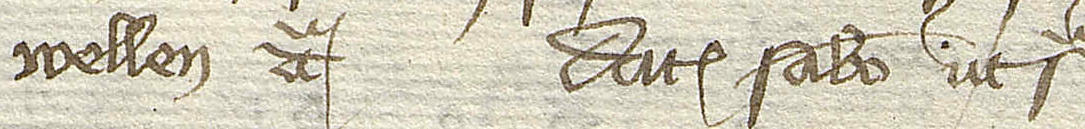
wellen ec* Dat* ſabo ut ſ*
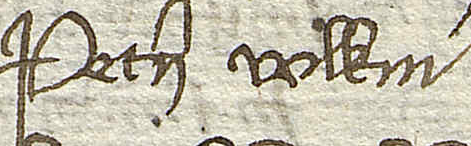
Pet*n volkm*
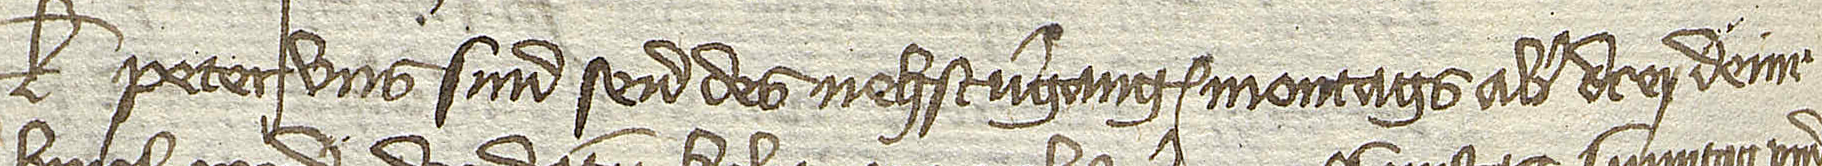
L* peter vns ſind ſeid des nehſtu*gang* montags ab* drey deinr
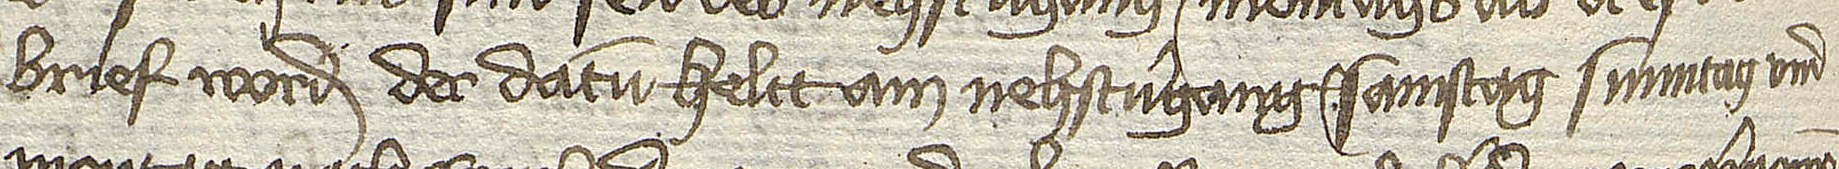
brief word* der datu* heltt am nehſtu*gang* ſamſtag ſunntag vnd
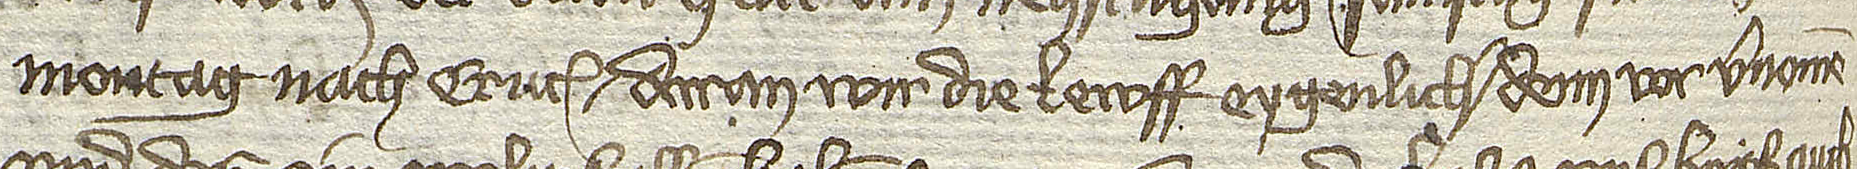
montag nach Cruc* / daran wir die lewff eygenlich* denn vor v*nome*
